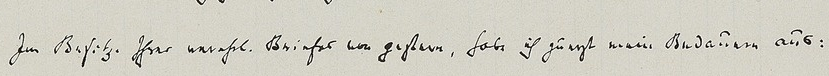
Im Besitze Ihres verehrl. Briefes von gestern, habe ich zuerst mein Bedauern aus-
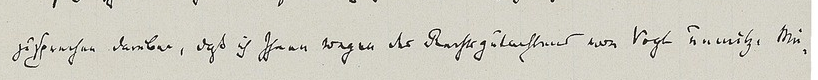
zusprechen darüber, daß ich Ihnen wegen des Rechtsgutachtens von Vogt unnütze Mü-
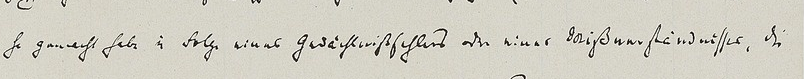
he gemachte habe in Folge eines Gedächtnißfehlers oder eines Mißverständnisses, die
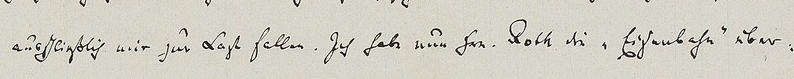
ausschließlich mir zur Last fallen. Ich habe nun Hrn. Roth die «Eisenbahn» über-
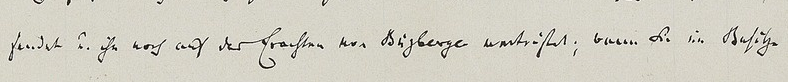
sendet u. ihn noch auf das Erachten von Büzberger vertröstet; wenn Sie im Besitze
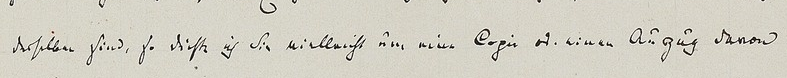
desselben sind, so dürfte ich Sie vielleicht um eine Copie od. einen Auszug davon
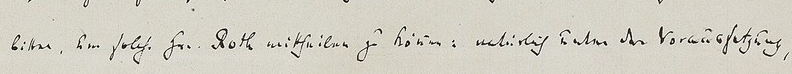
bitten, um solche Hrn. Roth mittheilen zu können: natürlich unter der Voraussetzung,
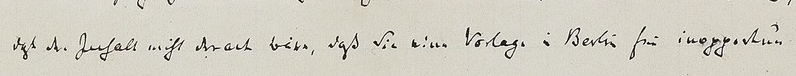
daß der Inhalt nicht derart wäre, daß Sie eine Vorlage in Berlin für inopportun
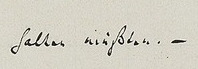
halten müßten. –
